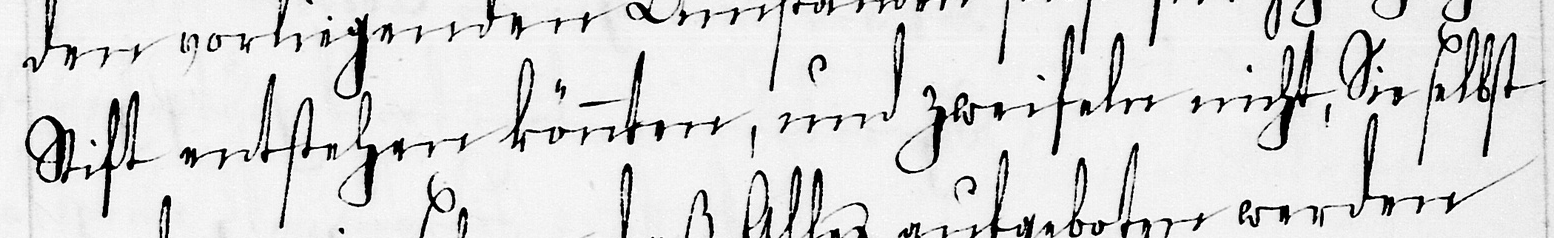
Stift entstehen könnten, und zweifeln nicht, Sie selbst
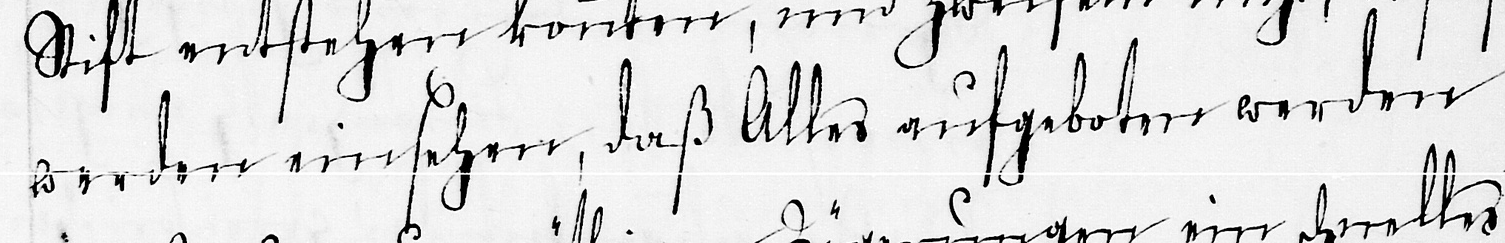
werden einsehen, daß Alles aufgeboten werden
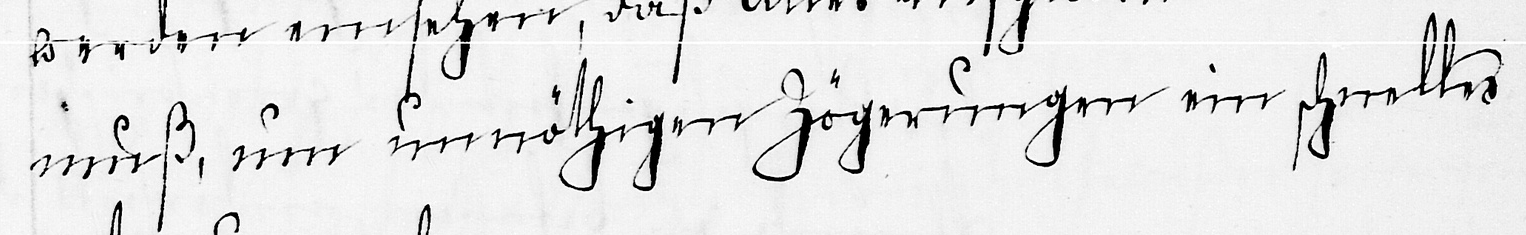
muß, um unnöthigen Zögerungen ein schnelles
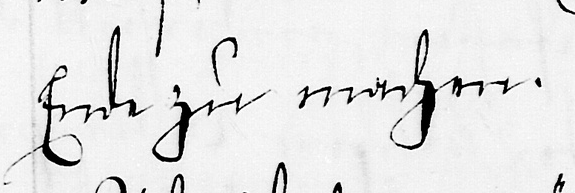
Ende zu machen.
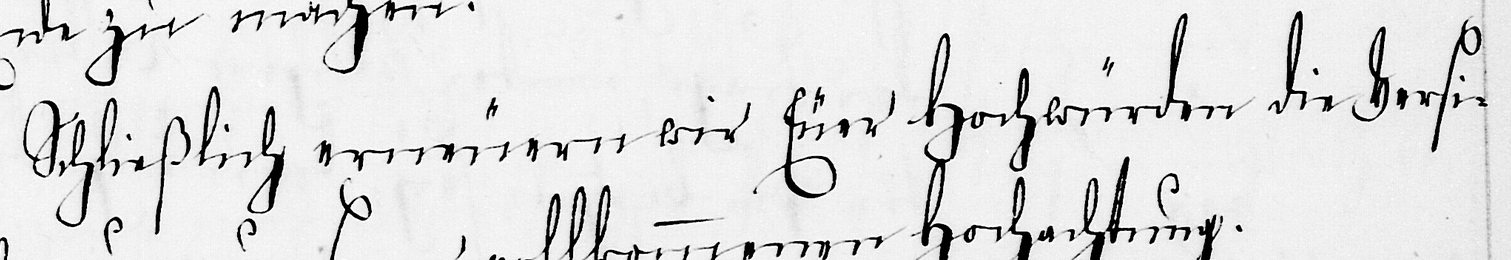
Schließlich erneuern wir Euer Hochwürden die Versi¬
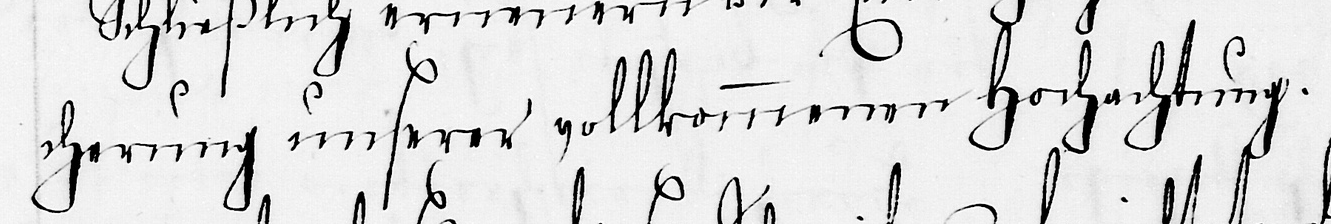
cherung unserer vollkommenen Hochachtung.
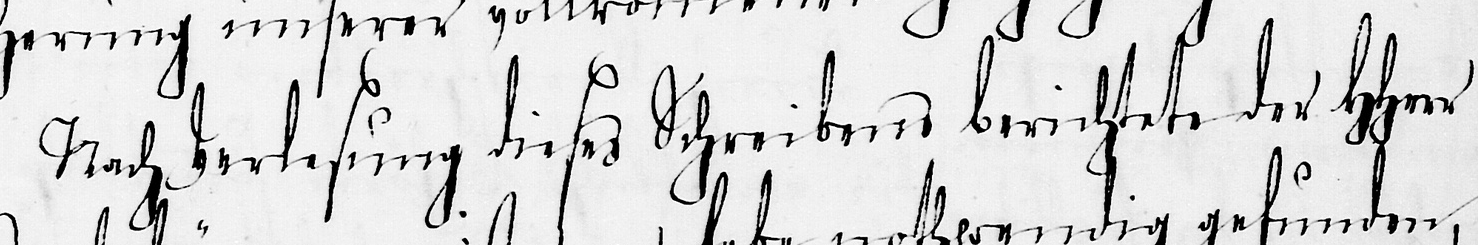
Nach Verlesung dieses Schreibens berichtete der
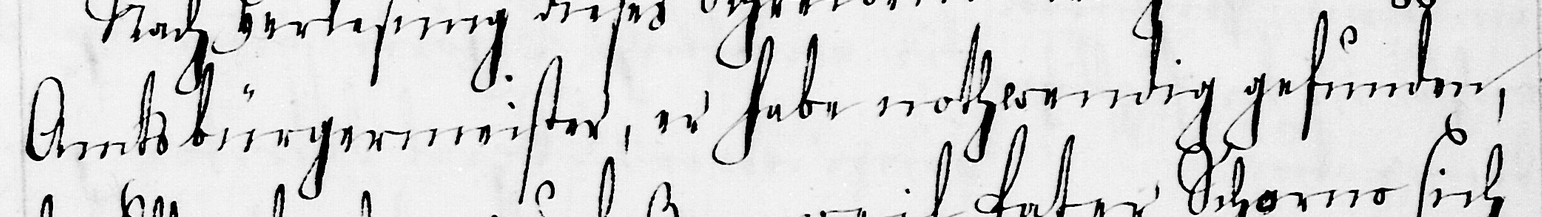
Amtsbürgermeister, er habe nothwendig gefunden,
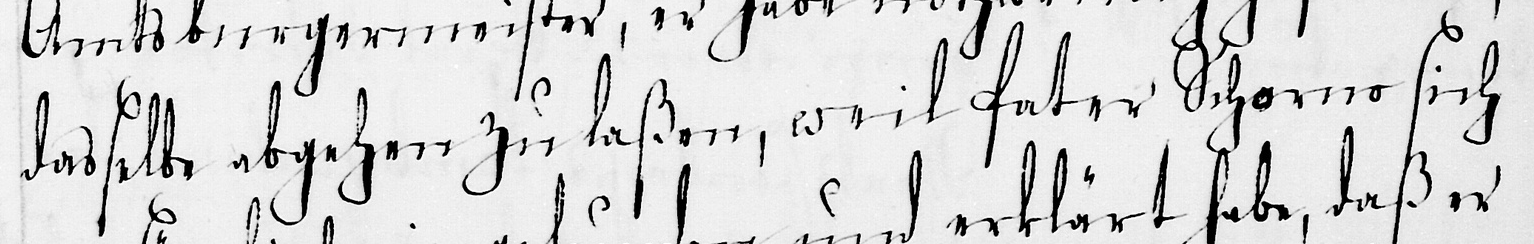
dasselbe abgehen zu laßen, weil Pater Schorno sich
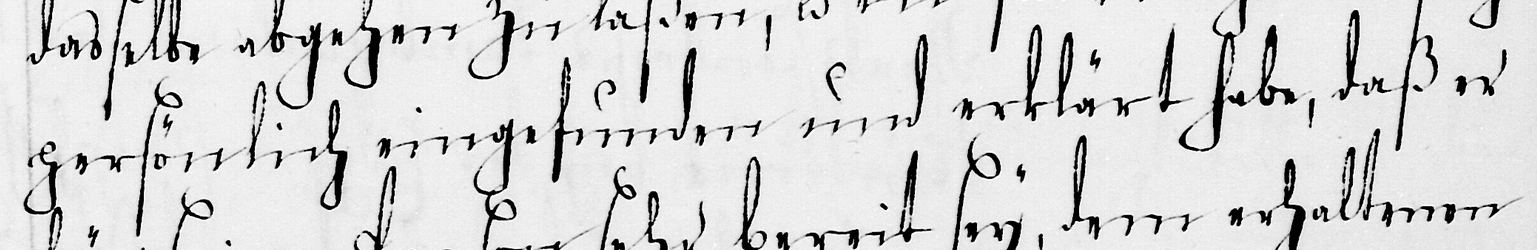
persönlich eingefunden und erklärt habe, daß er
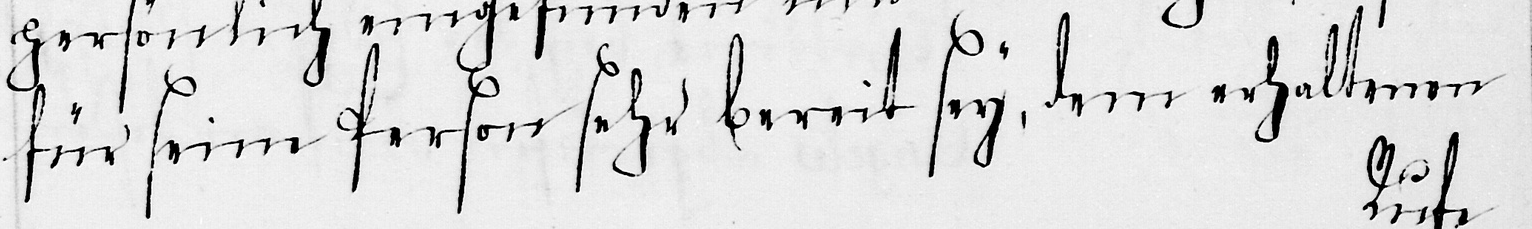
für seine Person sehr bereit sey, dem erhaltenen
